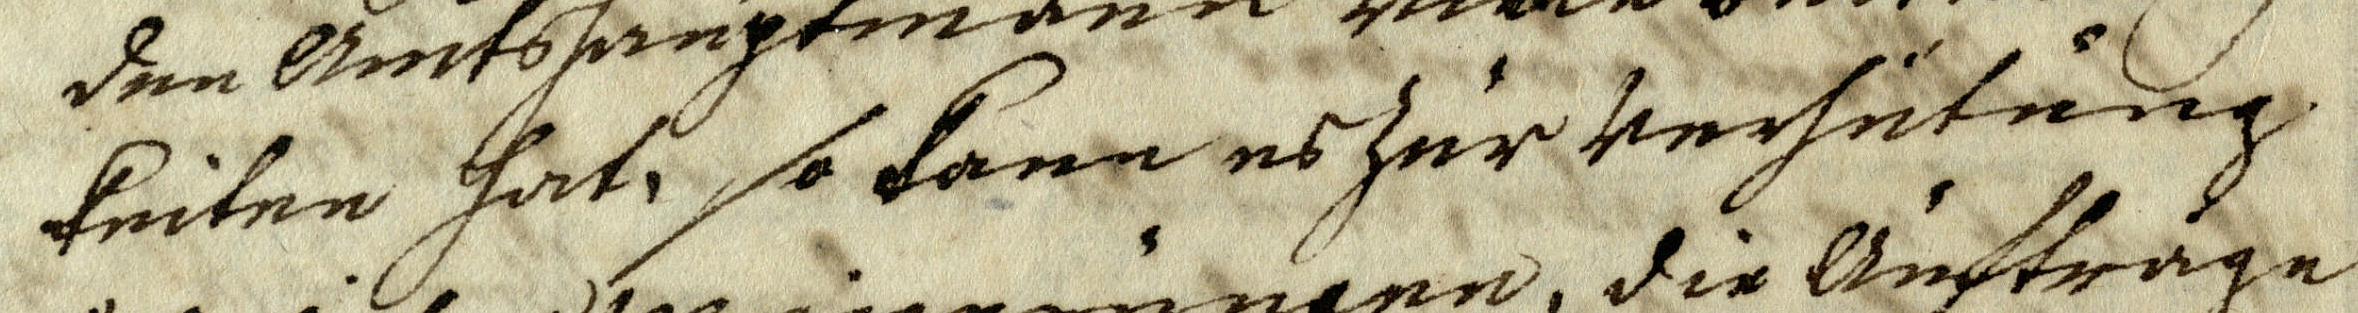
keiten hat, so kann es zur Verhütung
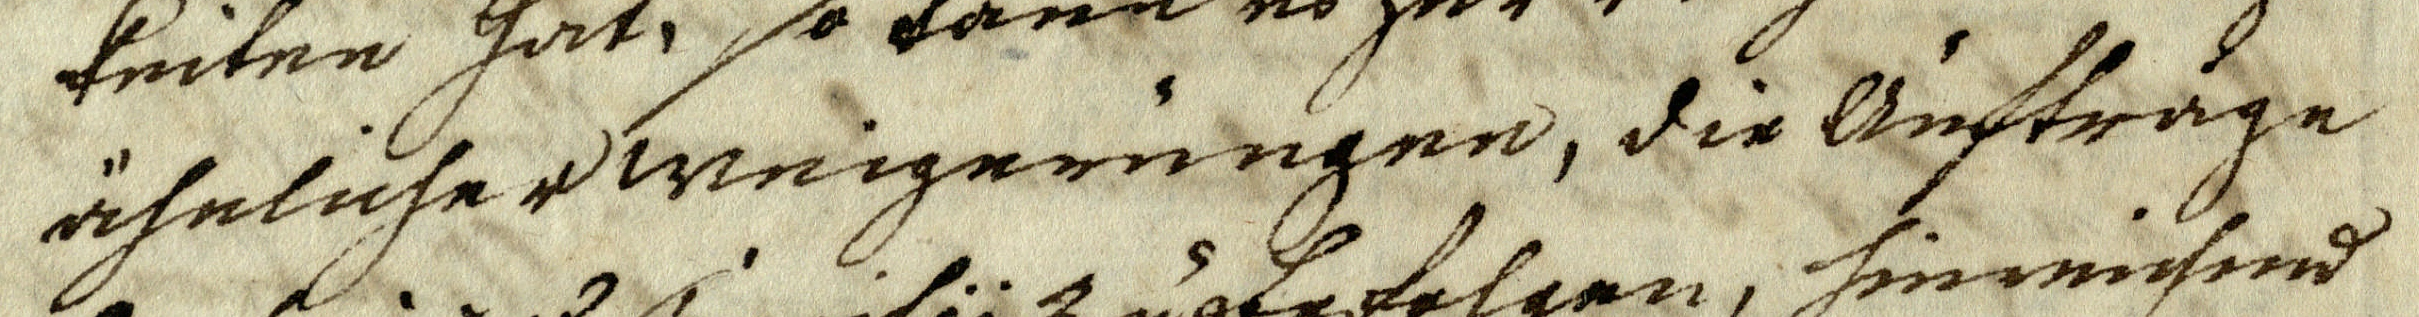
ähnlicher Weigerungen, die Aufträge
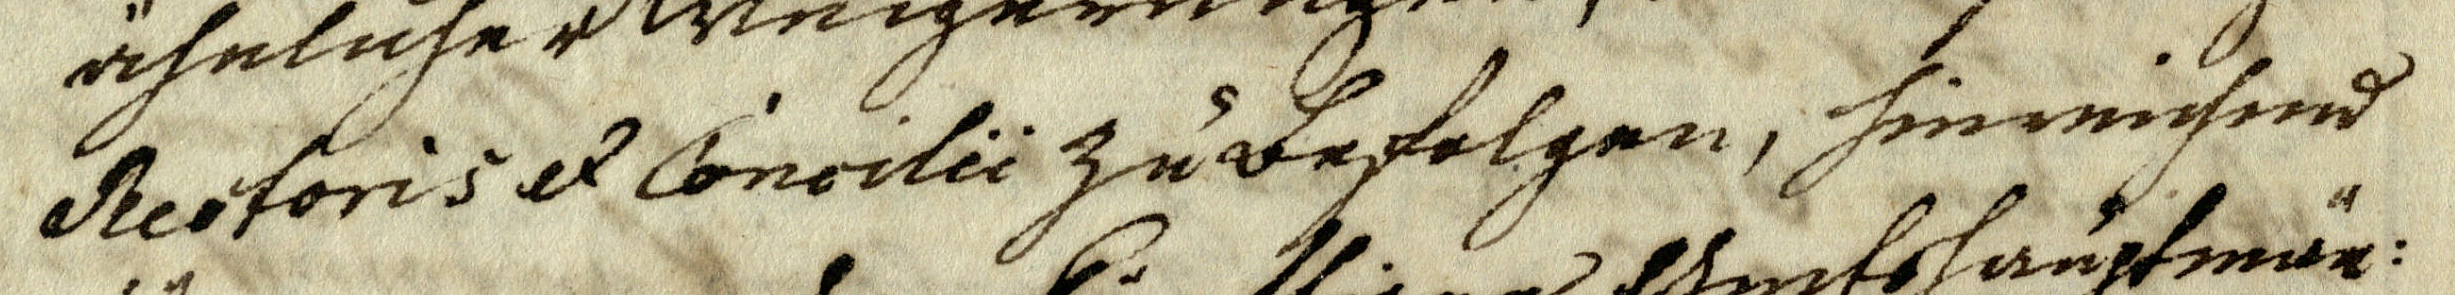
Rectoris et Concilii zu befolgen, hinreichend
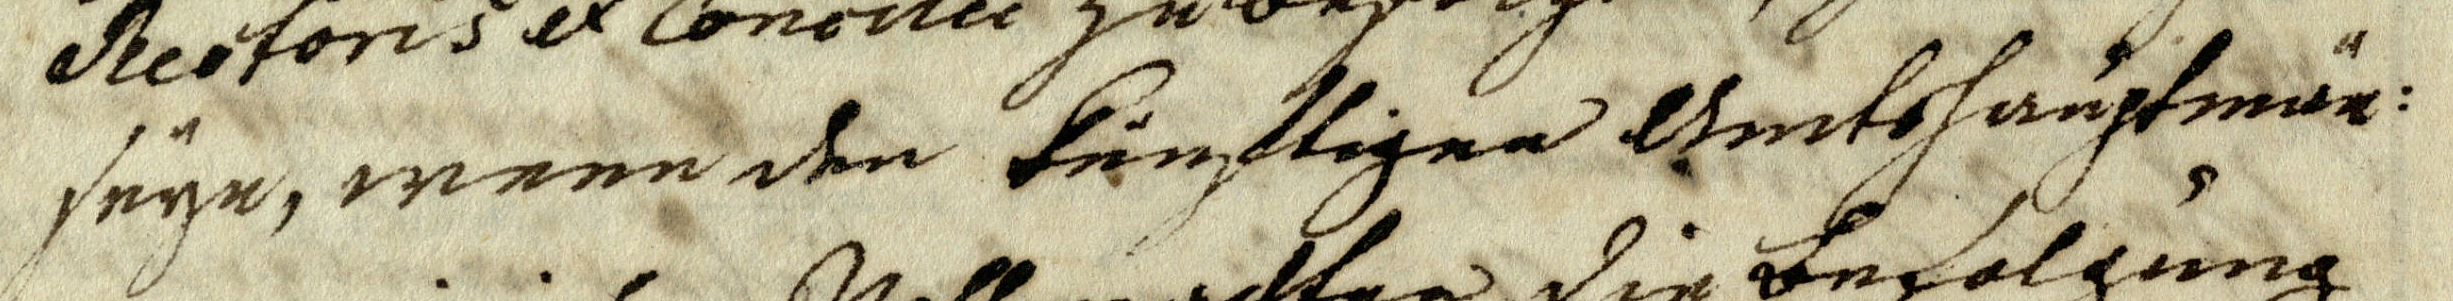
seÿn, wenn den künftigen Amtshauptmän¬
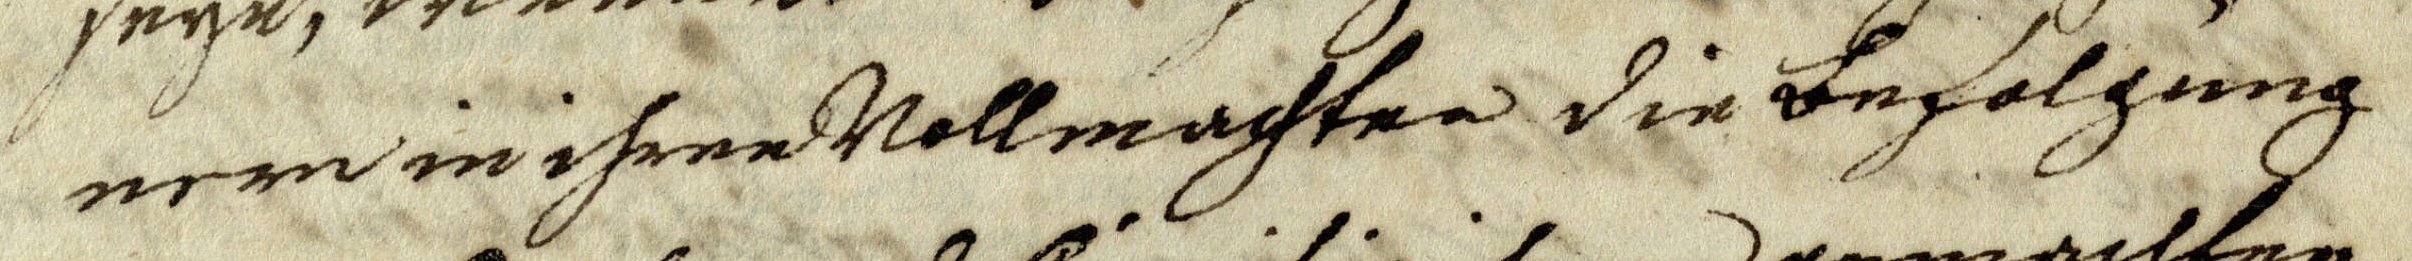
nern in ihren Vollmachten die Befolgung
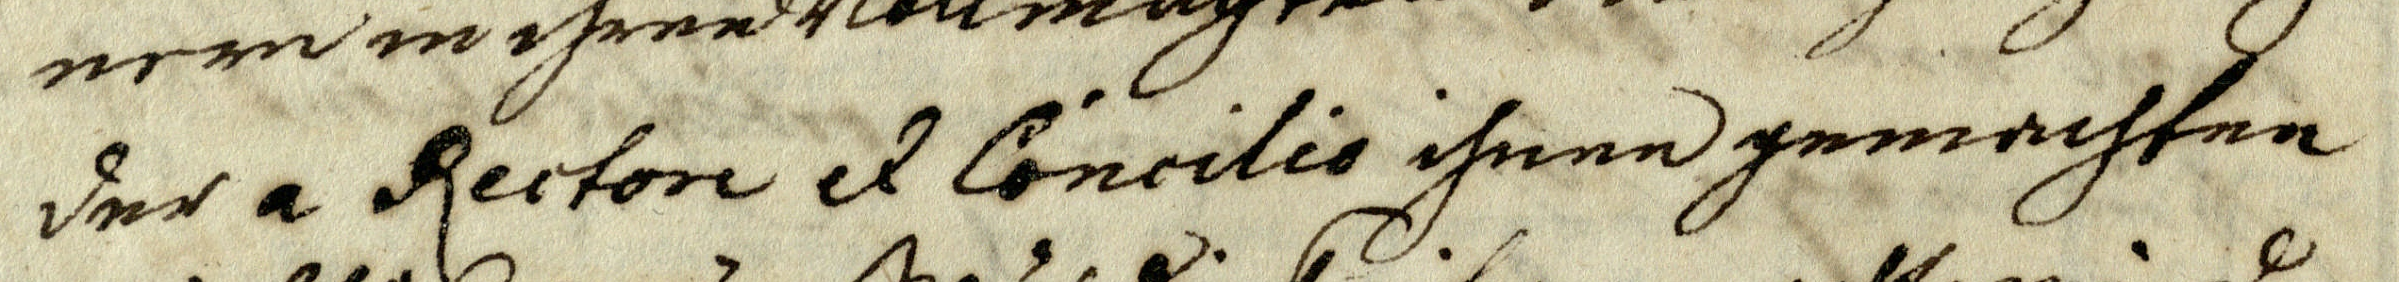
der a Rectore et Concilio ihnen gemachten
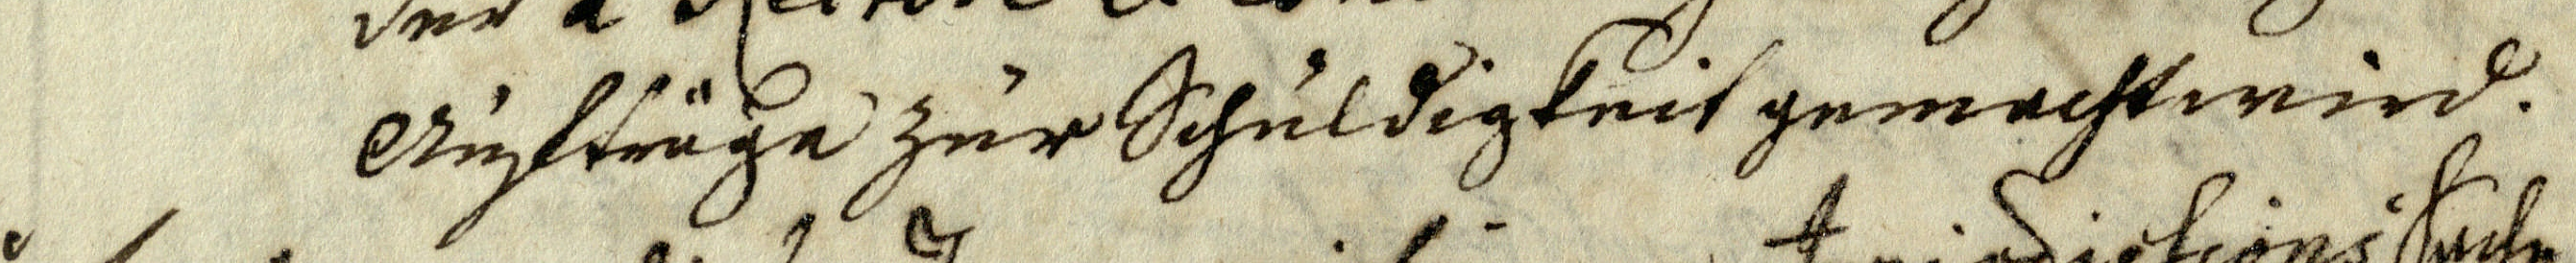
Aufträge zur Schuldigkeit gemacht wird.
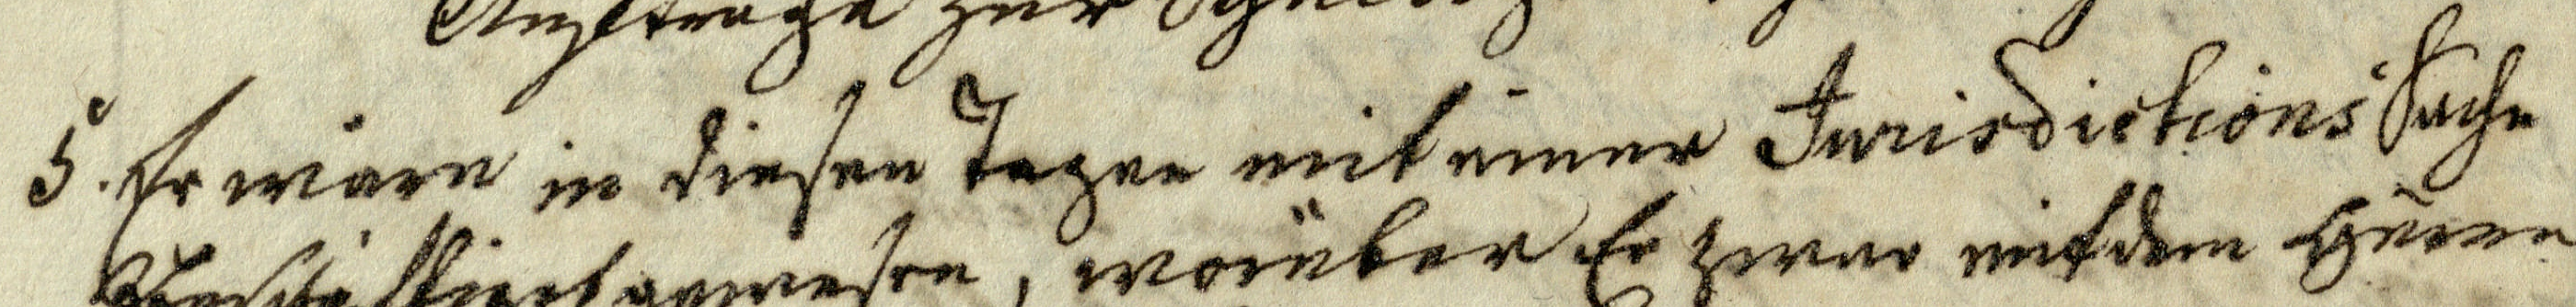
5. Er wäre in diesen Tagen mit einer Jurisdictions Sache
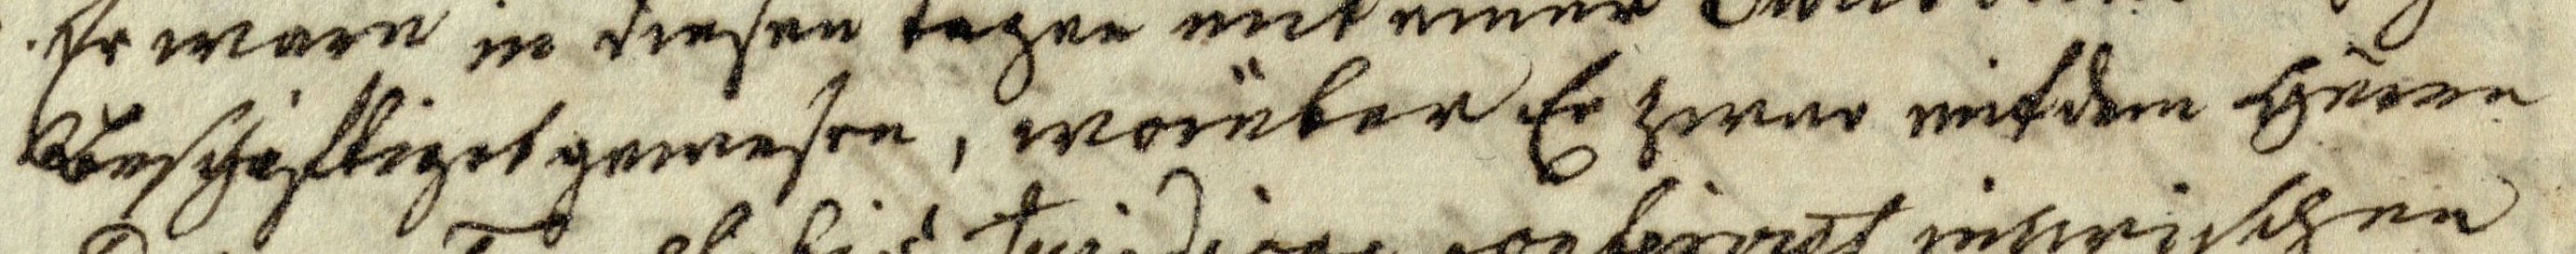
beschäftiget gewesen, worüber Er zwar mit dem Herrn
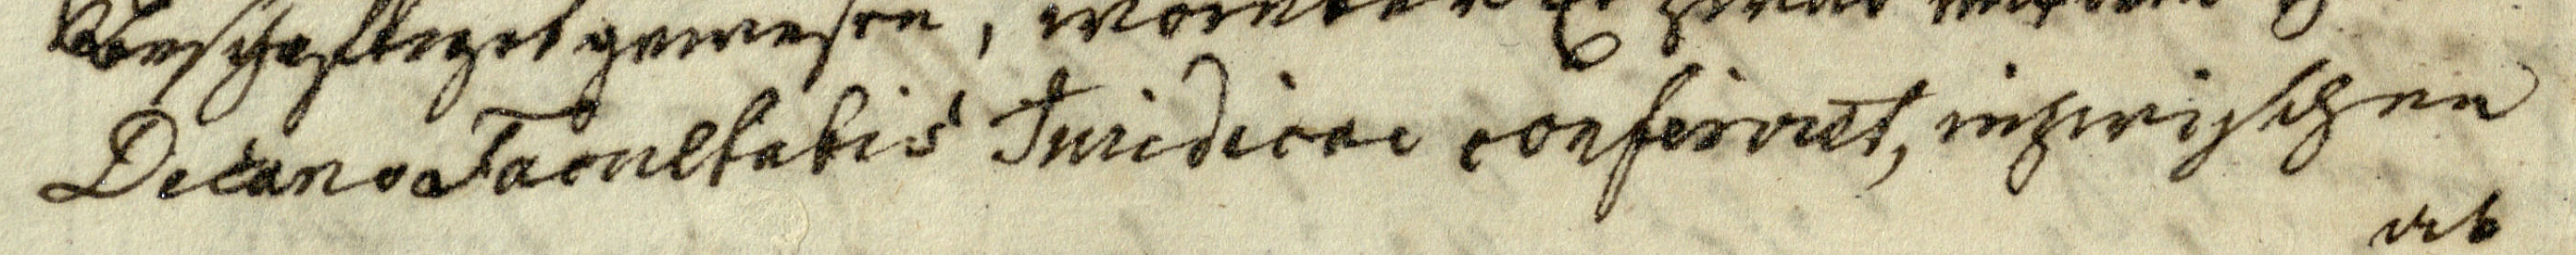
Decano Facultatis Juridicae conferiret, inzwischen
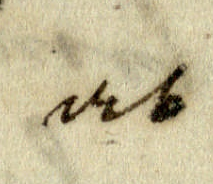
ab
